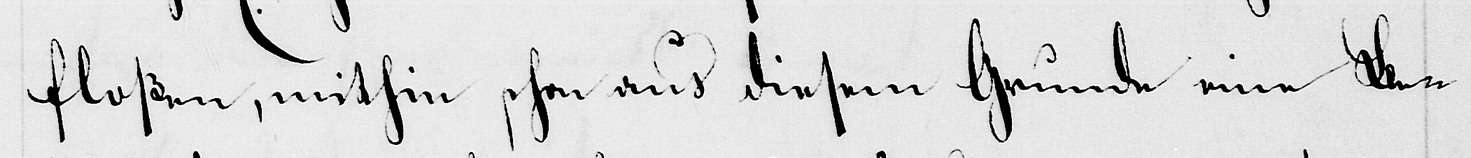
floßen, mithin schon aus diesem Grunde eine Be¬
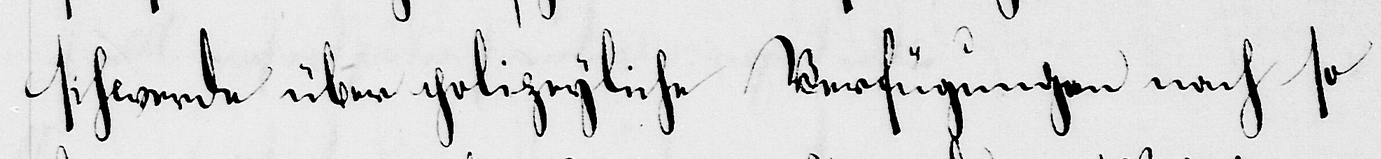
schwerde über polizeyliche Verfügungen nach so
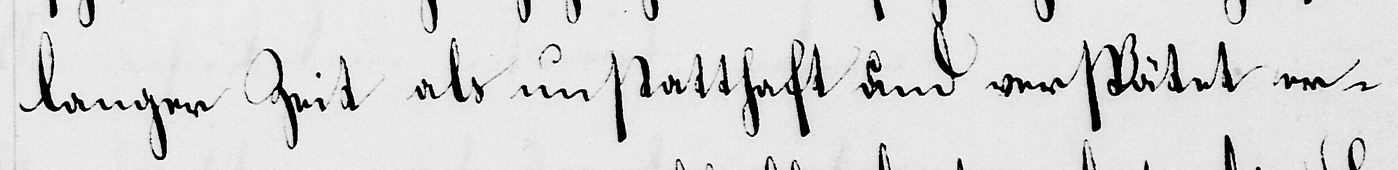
langer Zeit als unstatthaft und verspätet er¬
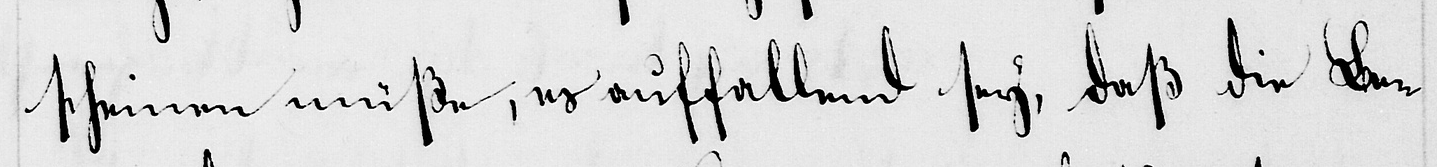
scheinen müße, es auffallend sey, daß die Be¬
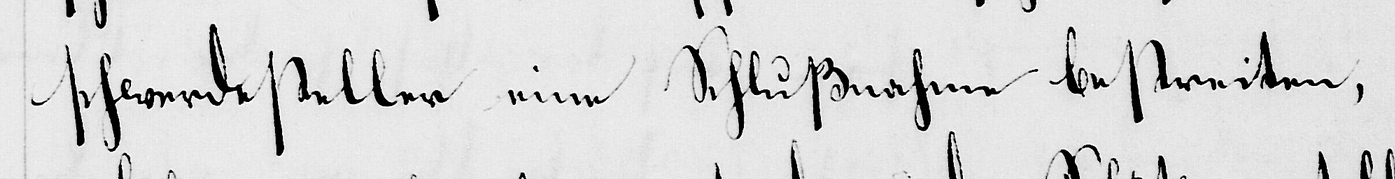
schwerdesteller eine Schlußnahme bestreiten,
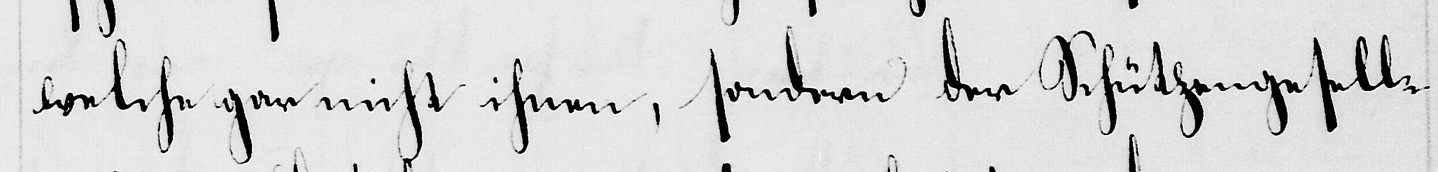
welche gar nicht ihnen, sondern der Schützengesell¬
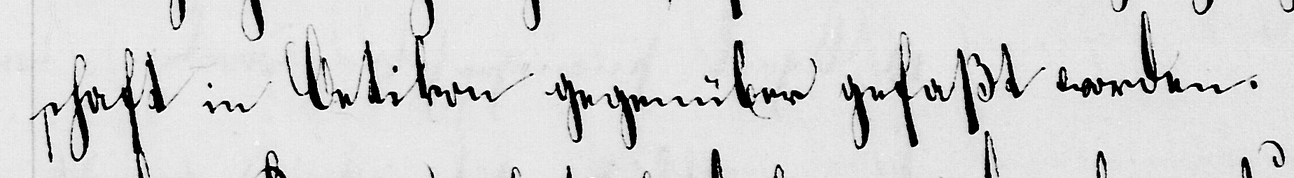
schaft in Oetikon gegenüber gefaßt worden.
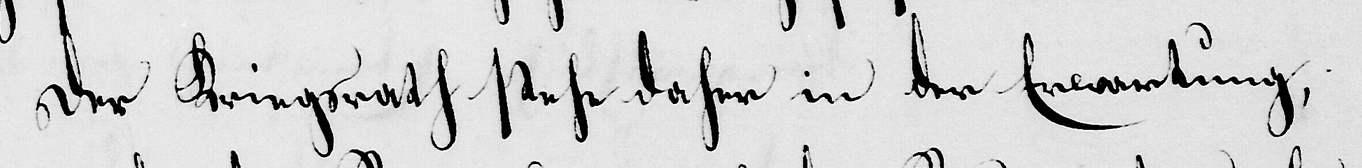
Der Kriegsrath stehe daher in der Erwartung,
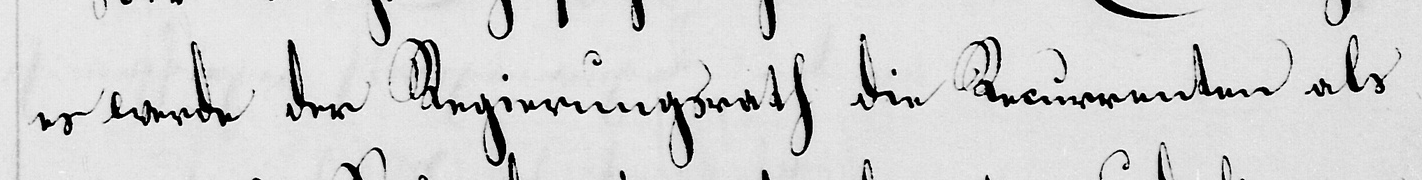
es werde der Regierungsrath die Recurrenten als
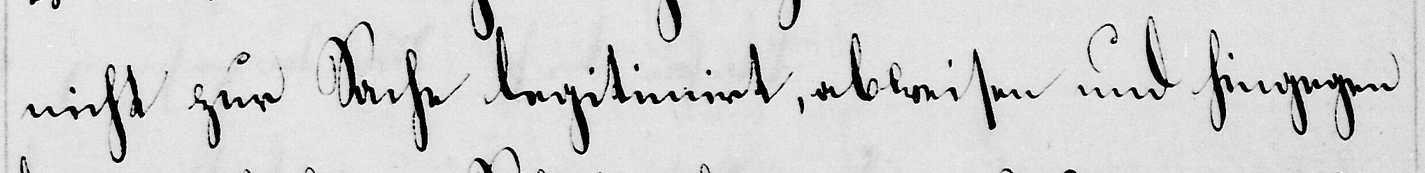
nicht zur Sache legitimirt, abweisen und hingegen
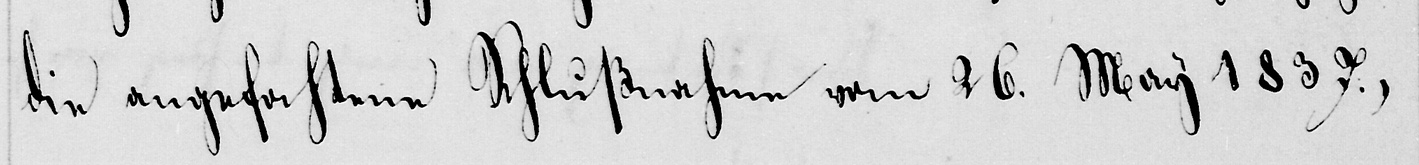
die angefochtene Schlußnahme vom 26. May 1837.,
